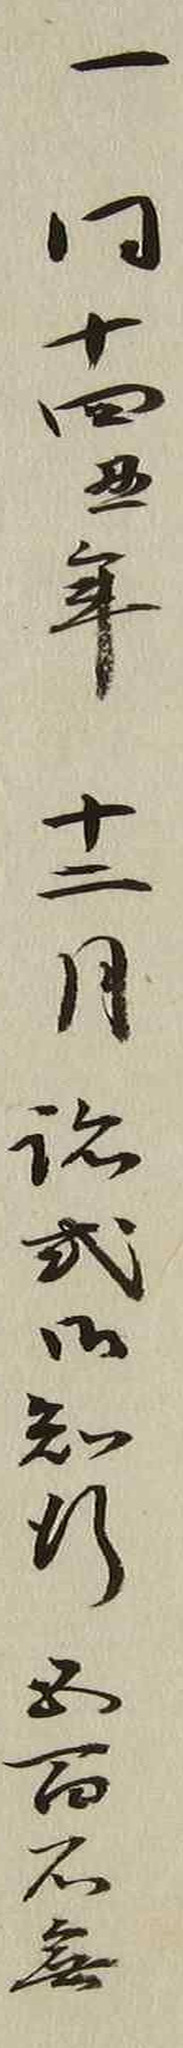一同十四丑年十二月諸式御知行五百石
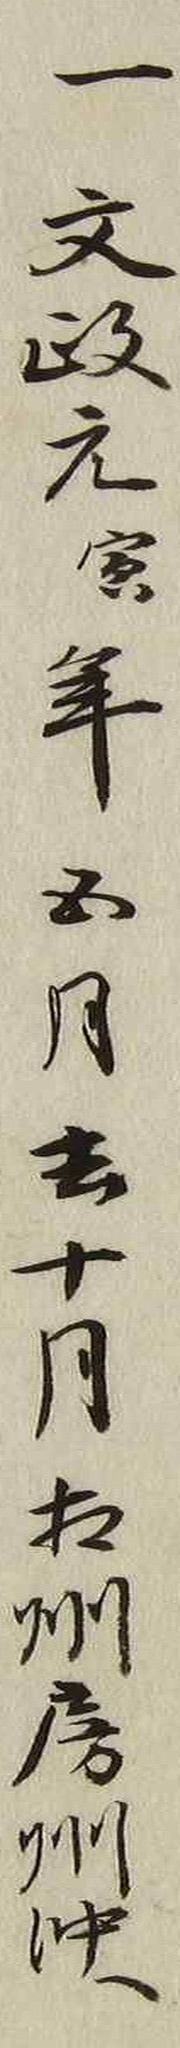一文政元寅年五月去る十月相州房州沖へ
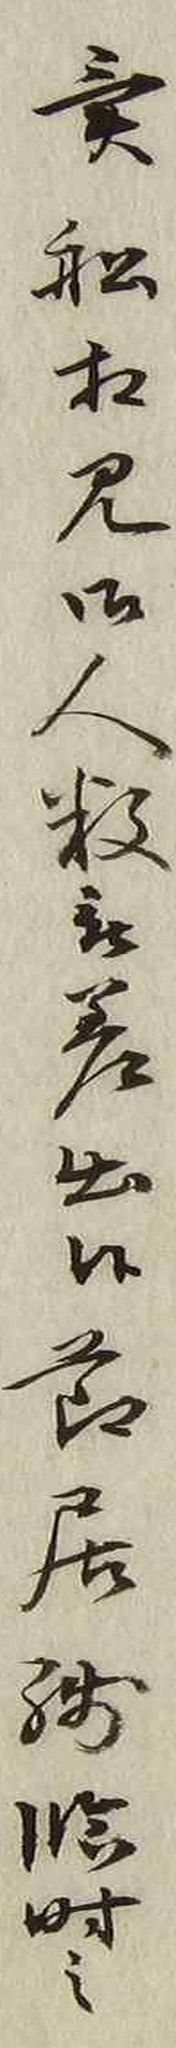異船相見御人数差し出され候節居残り臨時之
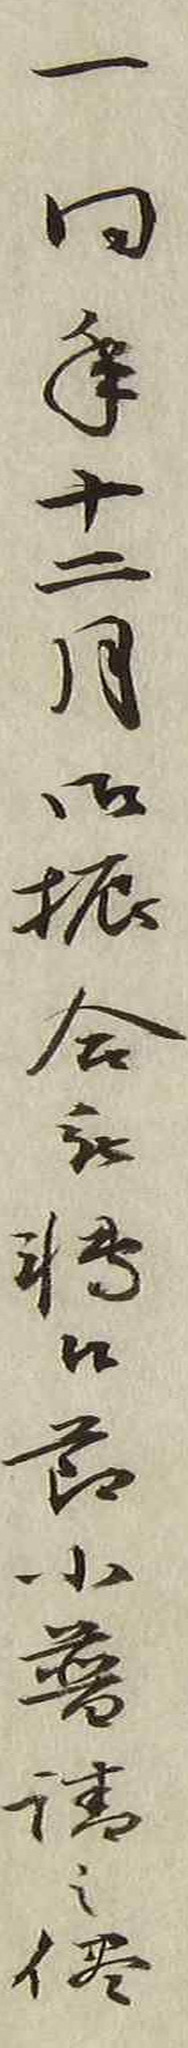一同年十二月御振合い伝えられ候節小普請之儘
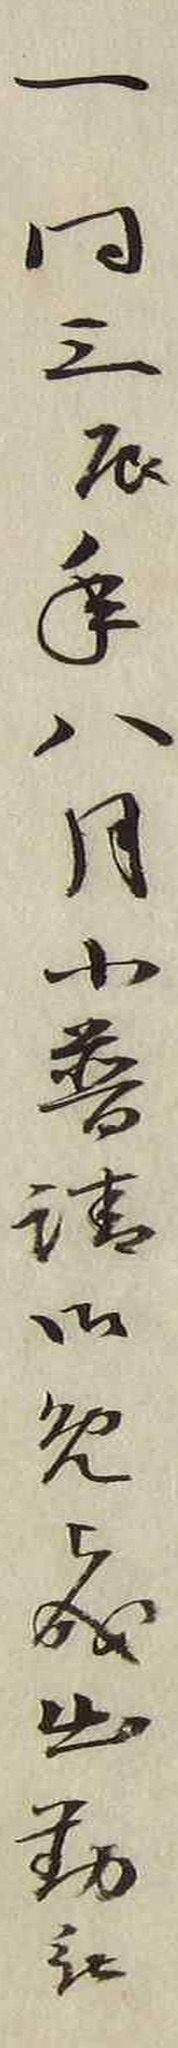一同三辰年八小普請御免成られ出勤

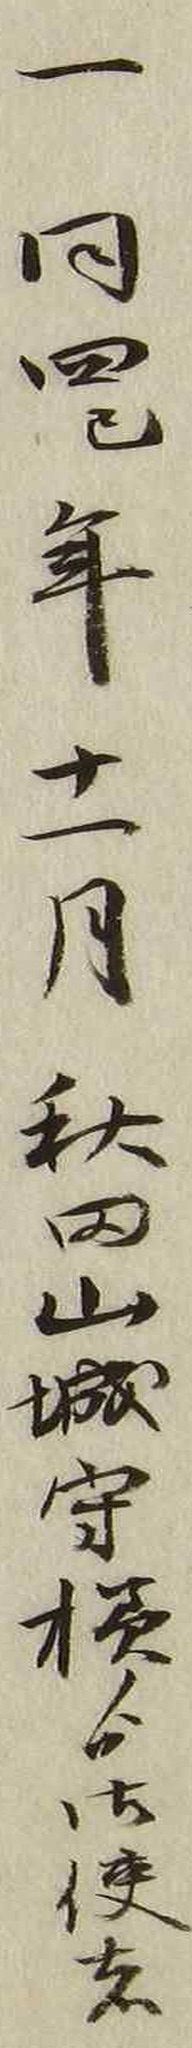一同四巳年十一月秋田山城守様より御使者
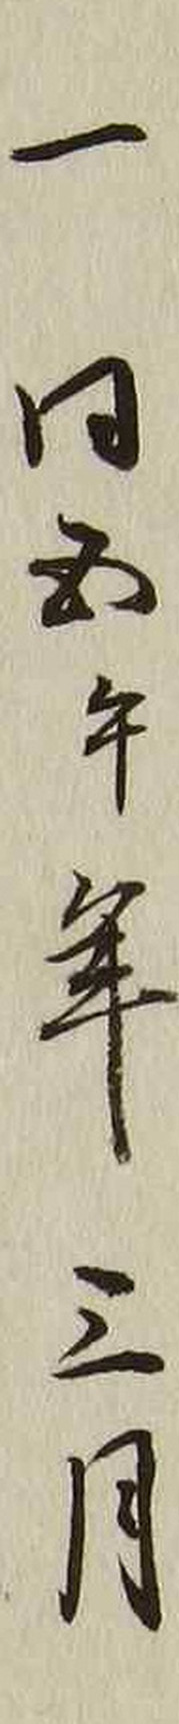一同五午年三月
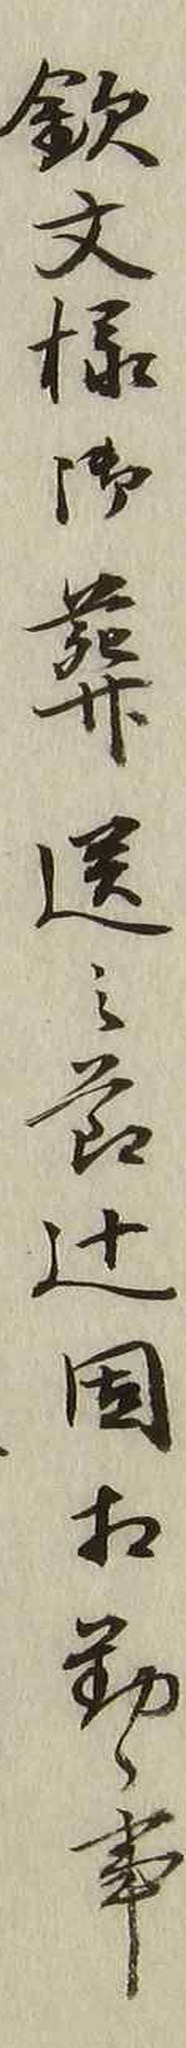欽文様御葬送之節辻固め相勤め候事
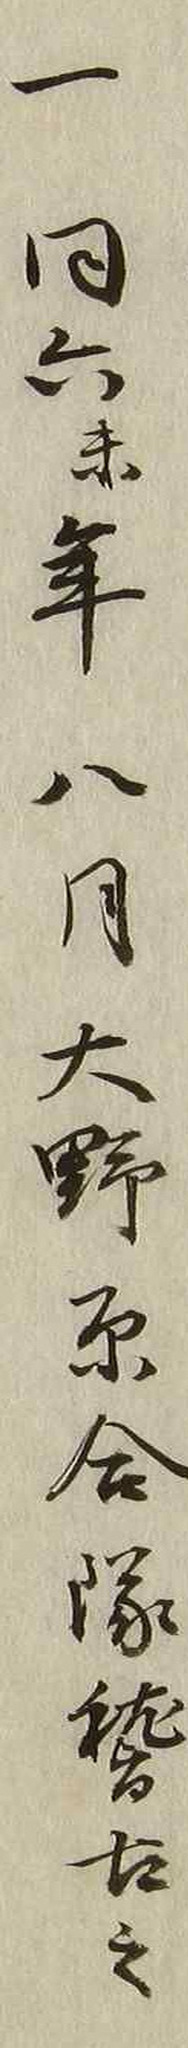一同六未年八月大野原合隊稽古之
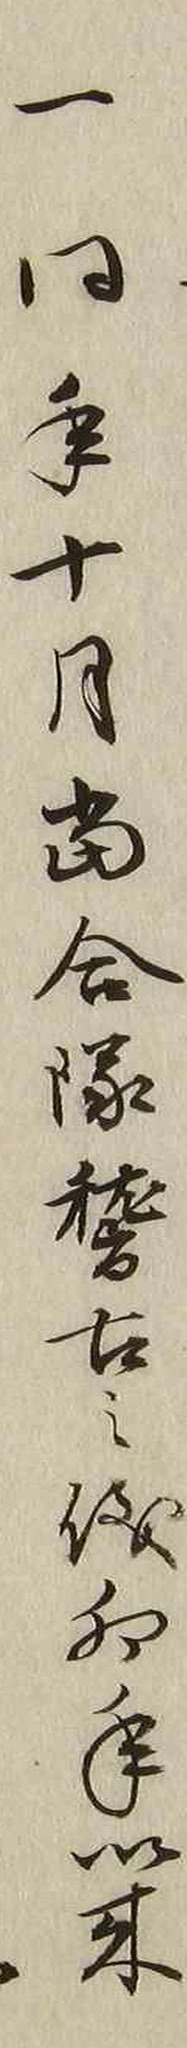一同年十月当合隊稽古之儀卯年月以来
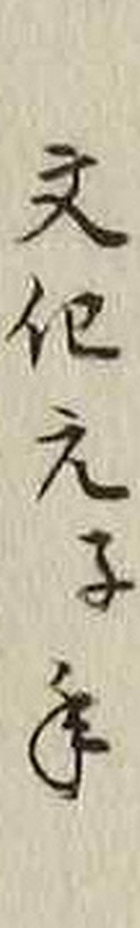文化元子年
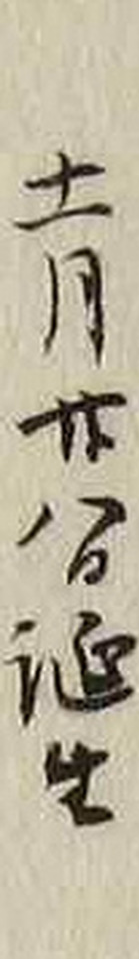十一月廿八日誕生
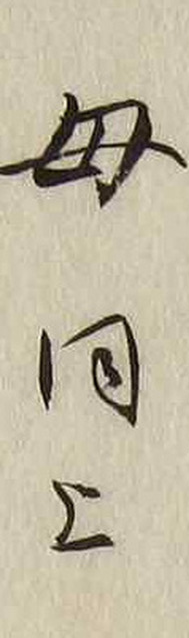母同上
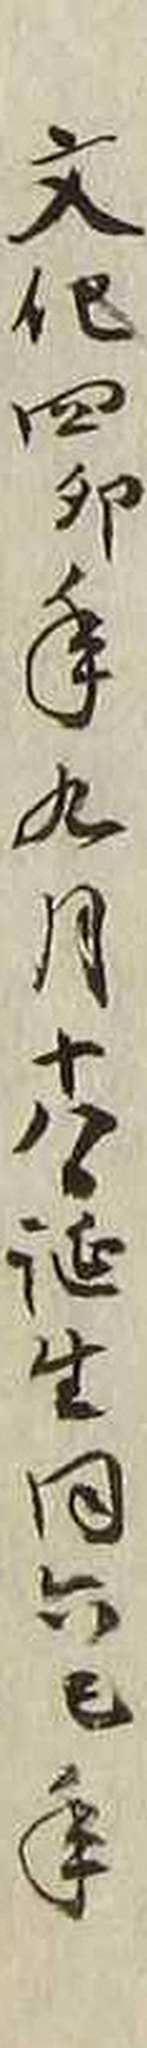左冨文化四卯年九月十八日誕生同六巳年
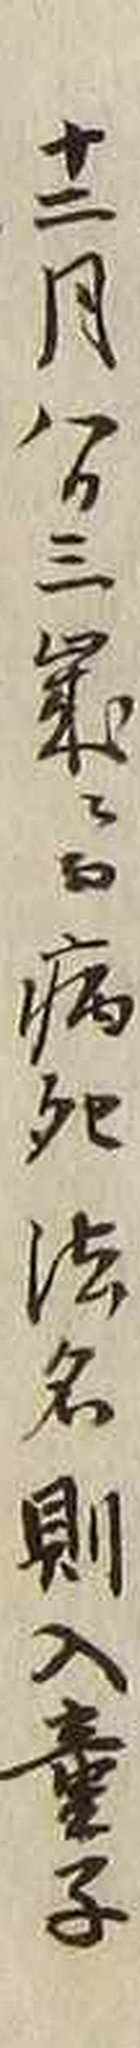十二月八日三歳ニて病死法名則入童子

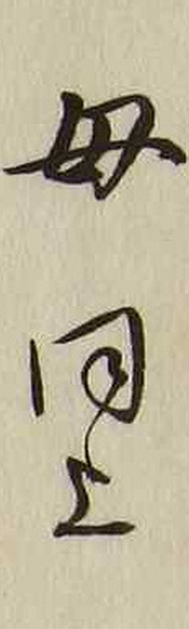母同上
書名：諸士系譜　巻之16　い之部16
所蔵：会津若松市立会津図書館
